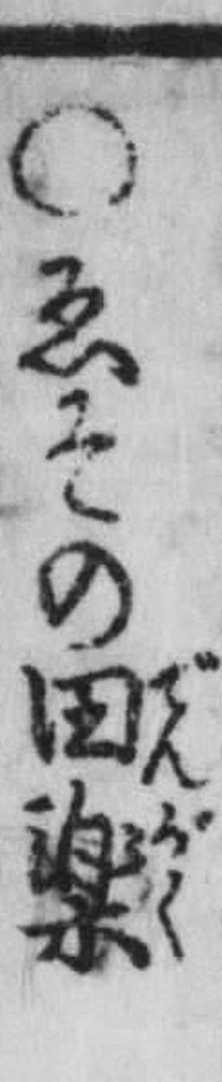○ゑその田楽
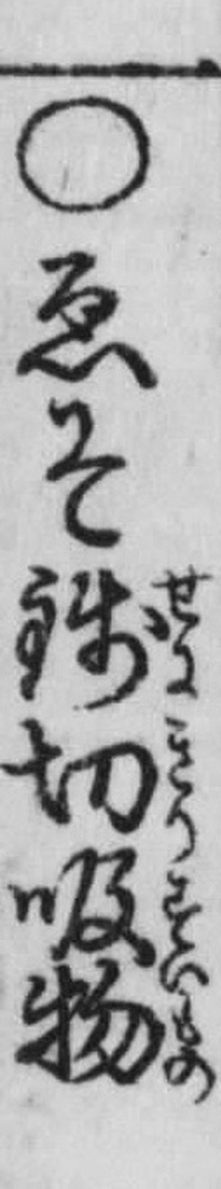○ゑそ銭切吸物
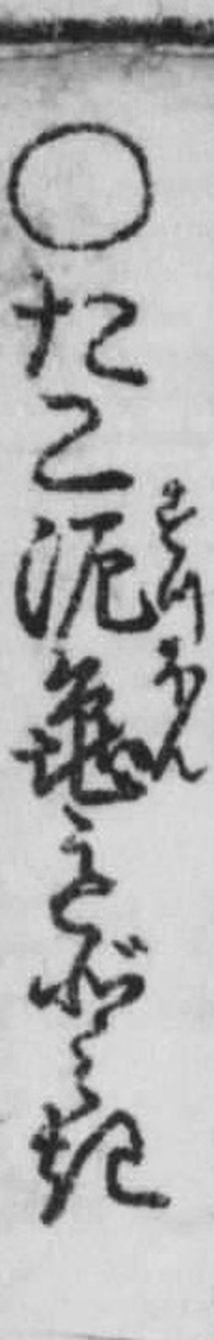○たこ泥亀もどき
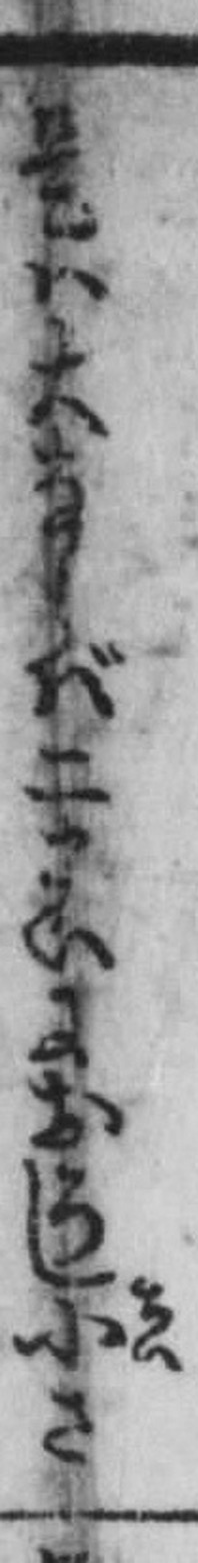是は大ならば二まいにおろし小さ
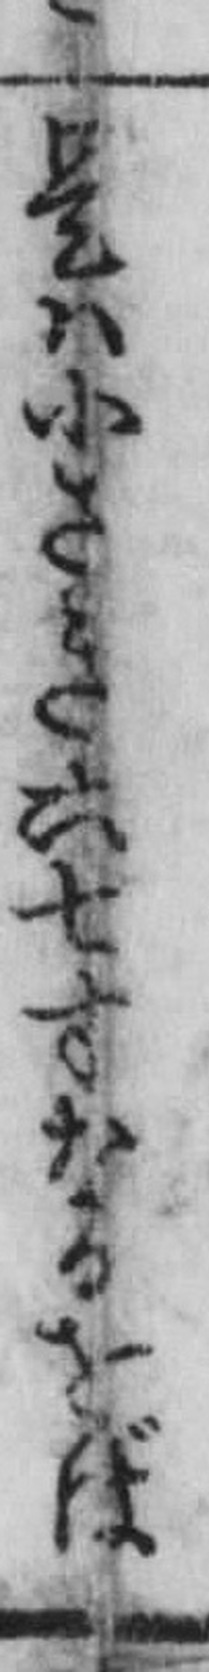是は小さき六七寸なるをば
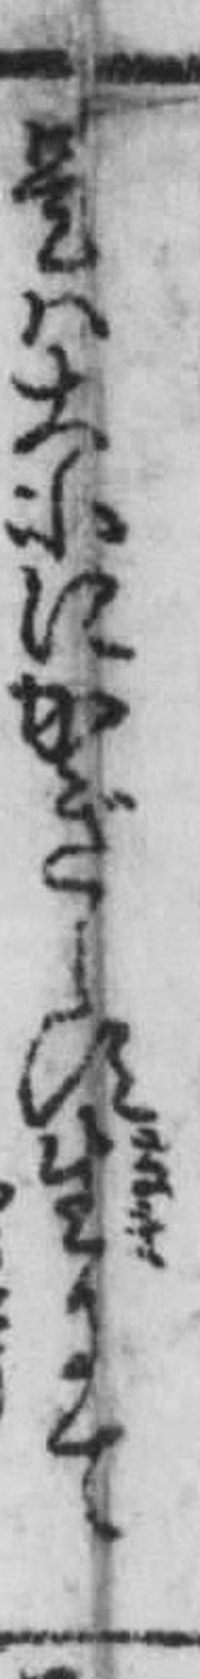是は大小にかぎらす生にて
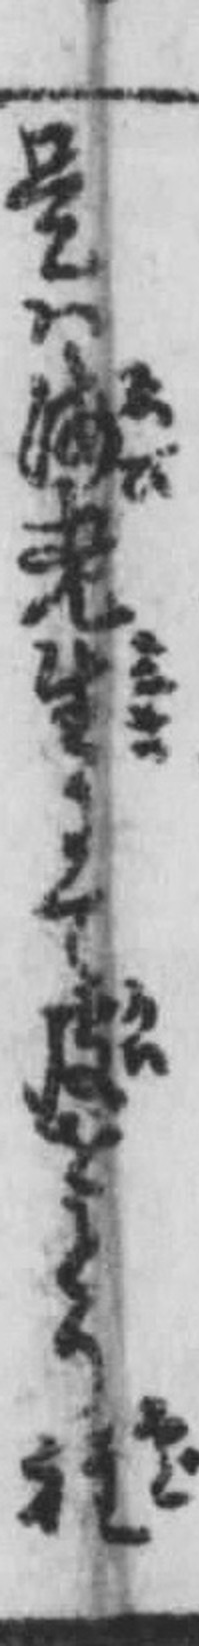是は海老生にて皮をとり程
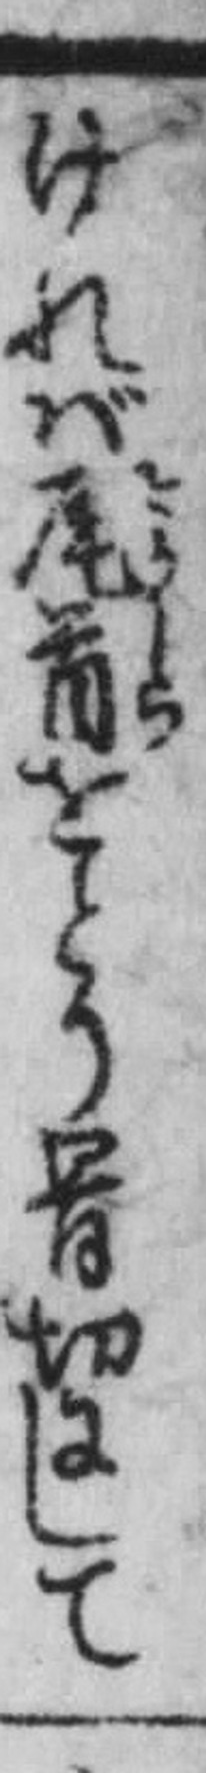ければ尾首をとり骨切にして
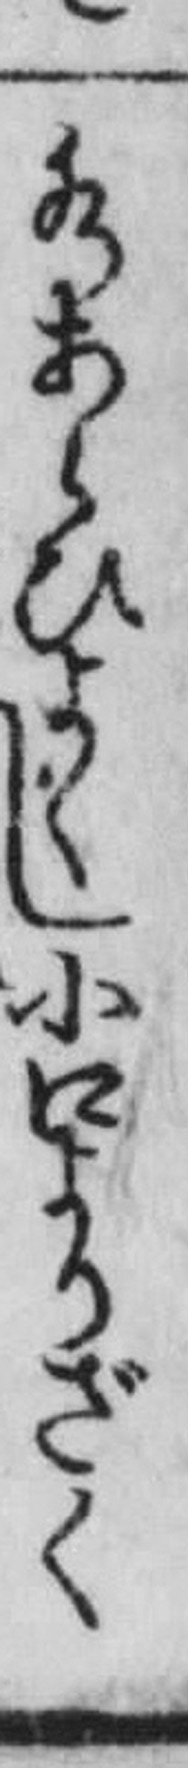水あらひよくし小口よりざく
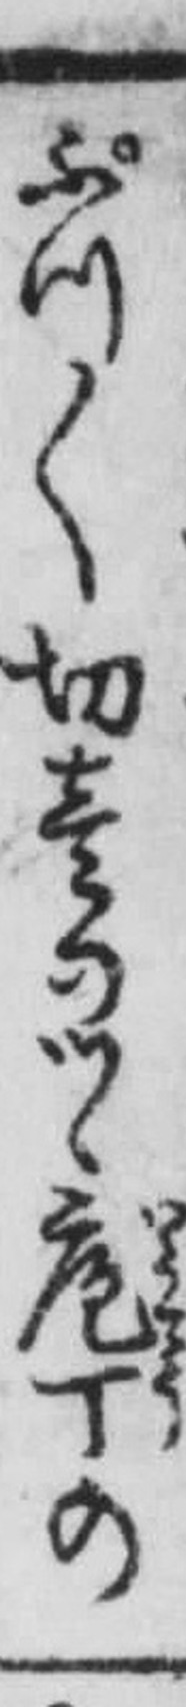ぷつ〳〵切壱つつゝ庖丁の
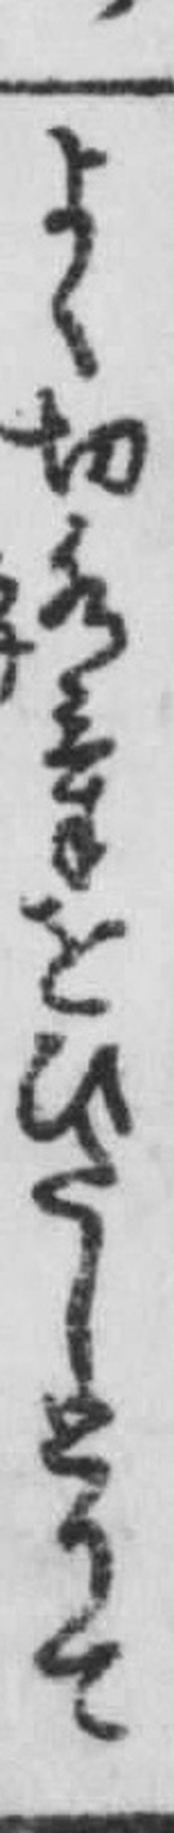よく切水気をひたしとりて
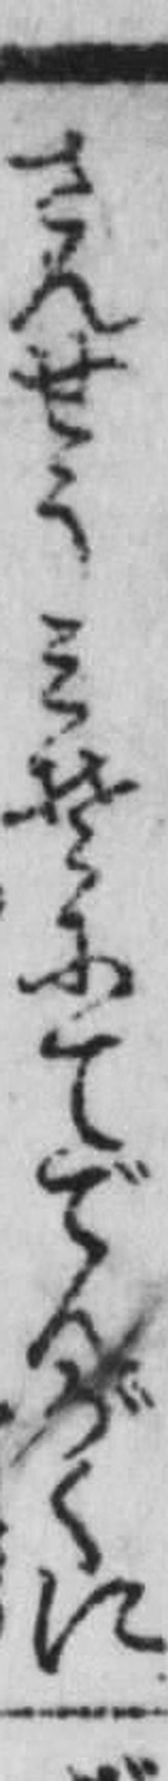さんせうみそにてでんがくに
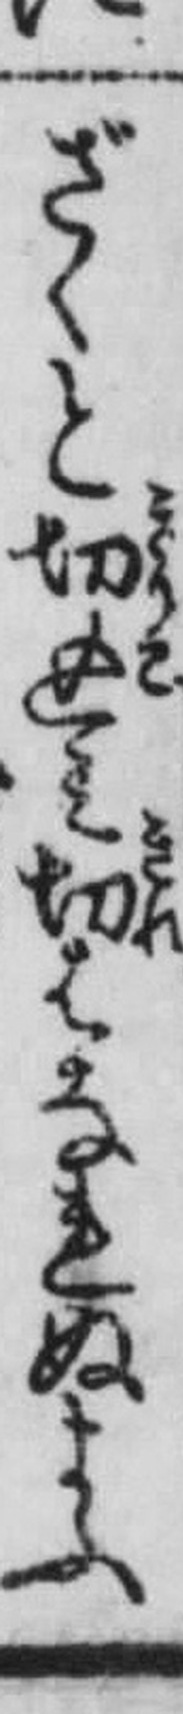ざくと切込み切はなれぬよふ
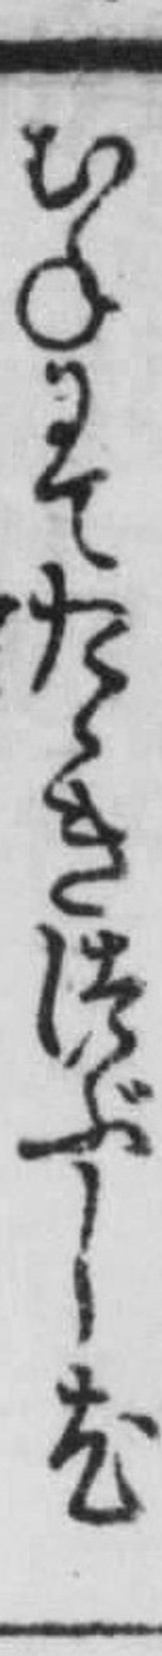むねにてたゝきつぶし尤
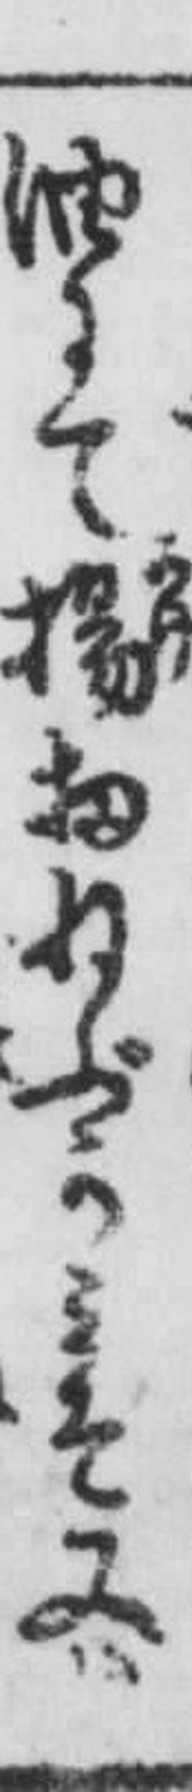油にて揚扨ねぶかのみそ又は
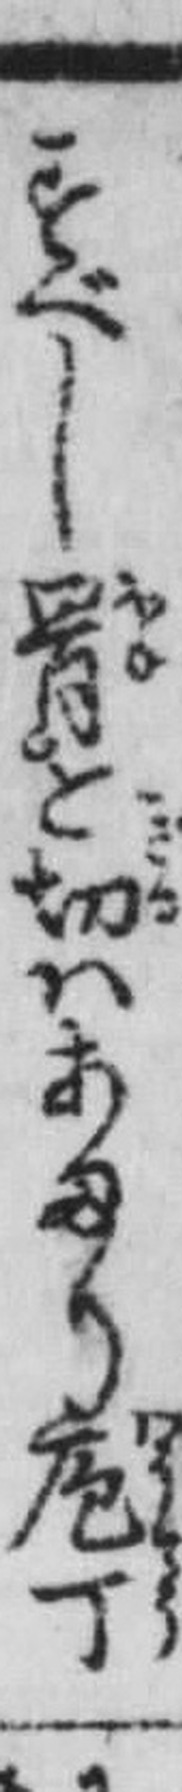すべし骨を切はあまり庖丁
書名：精進魚類間合料理/早速庖丁
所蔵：大阪府立大学学術情報センター 国文学研究資料館
